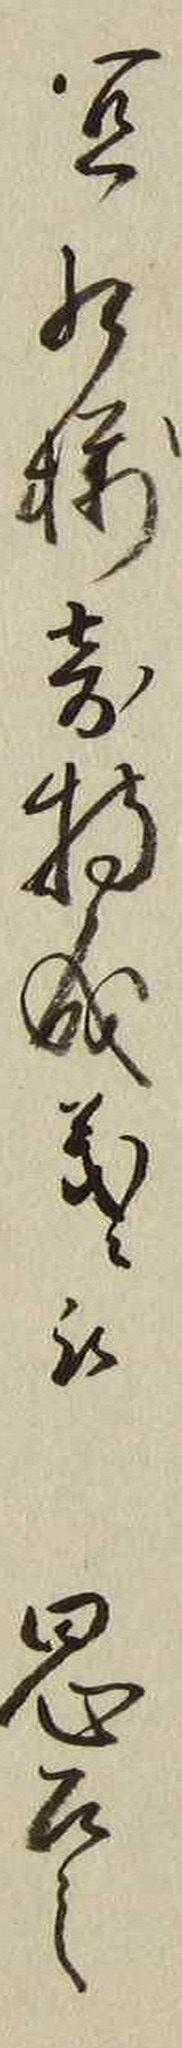宜相揃寄持成義ニ被思召之
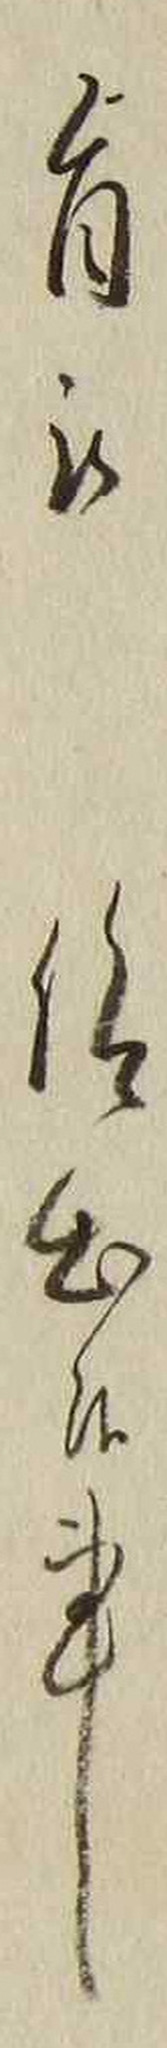旨被仰出候事
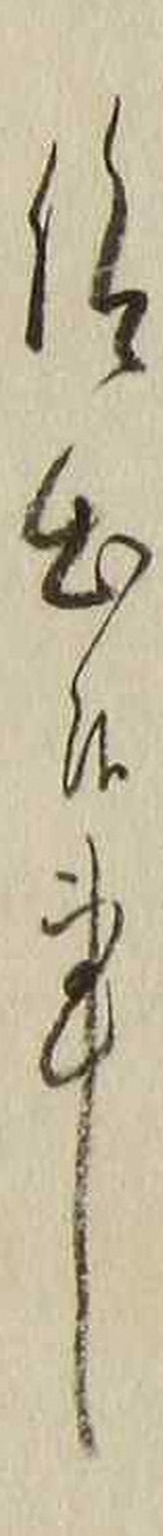仰付候事

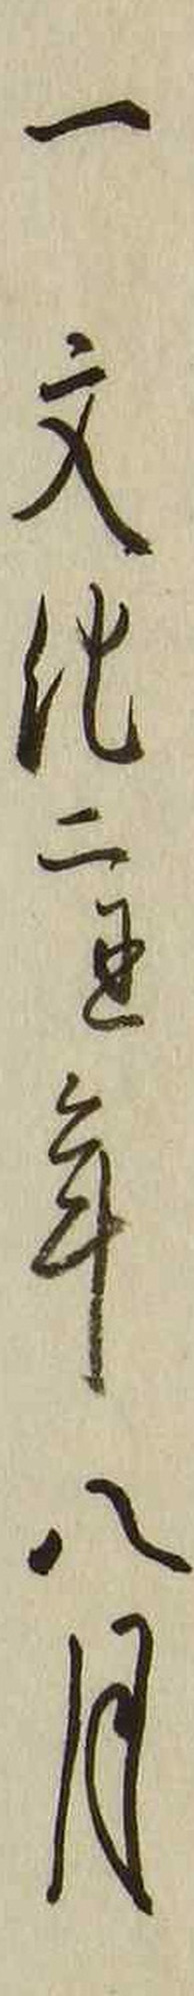一文化二丑年八月
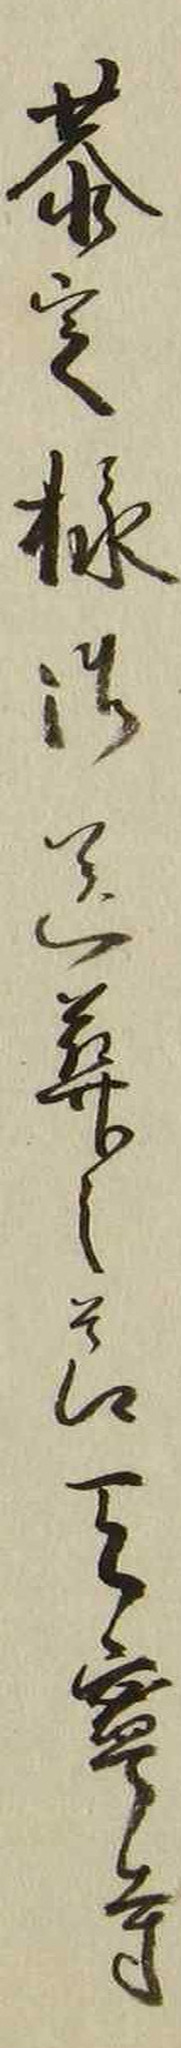恭定様御葬送之節天寧寺
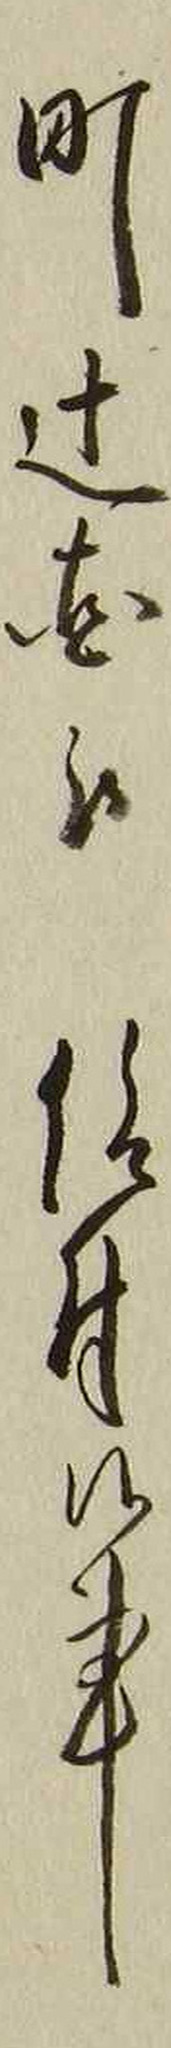町辻固被仰付候事
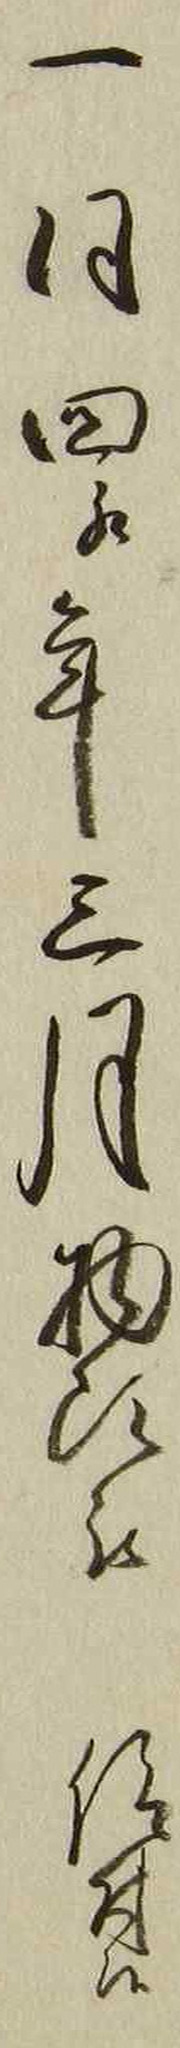一同四卯年三月物頭被仰付候
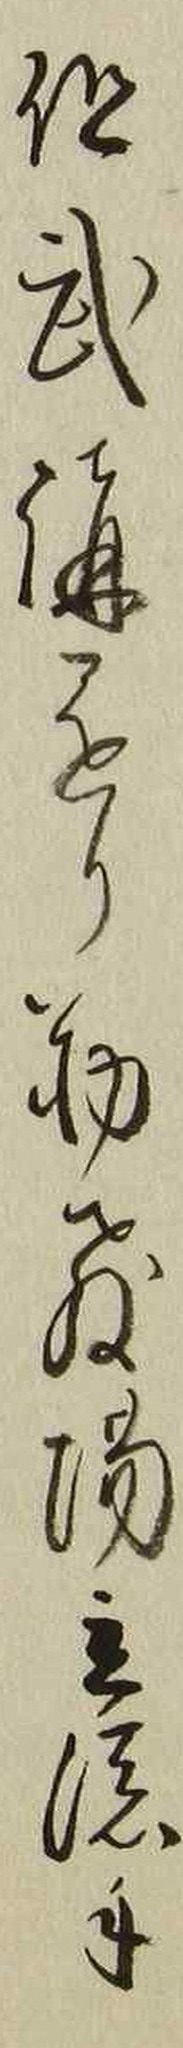但武講懸り勤教場立添手
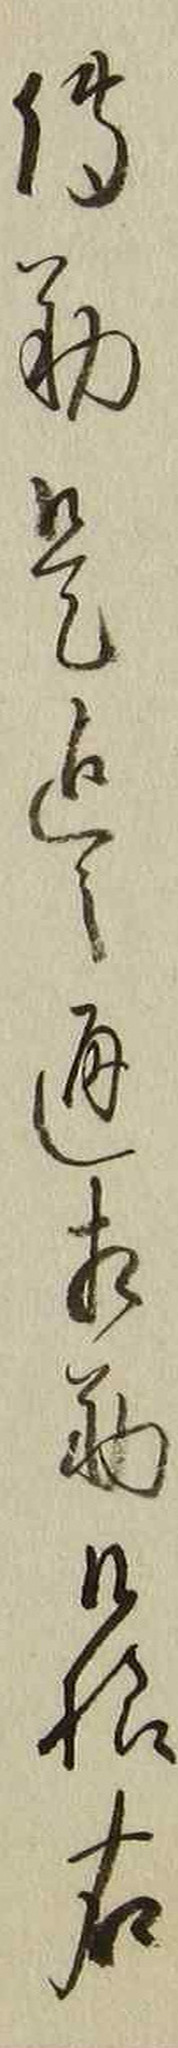伝勤是迄之通相勤候様右
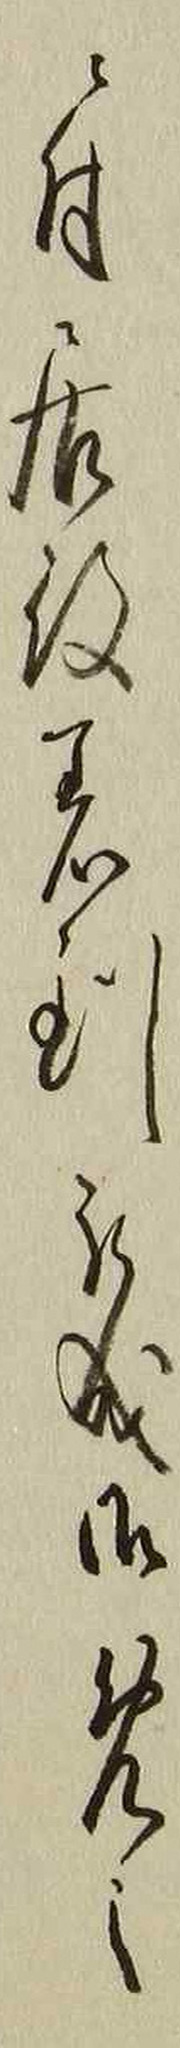ニ付居役着到被成御免之
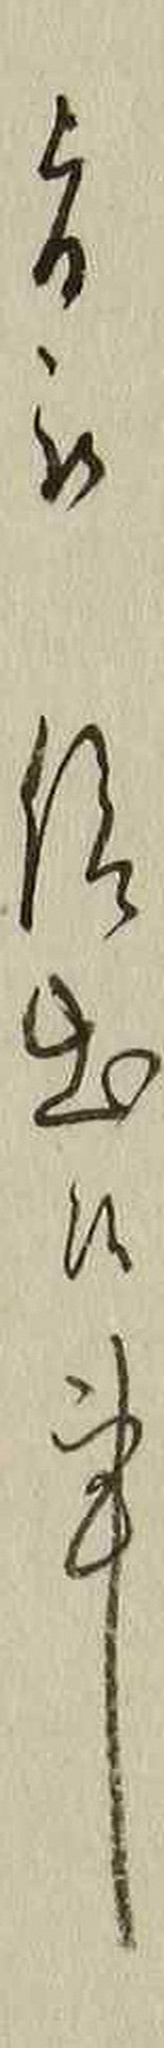旨被仰出事候
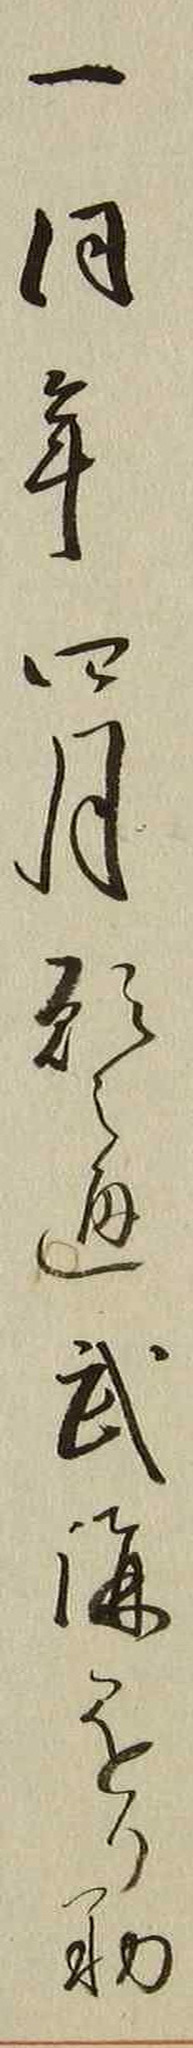一同年四月願之通武講懸り勤
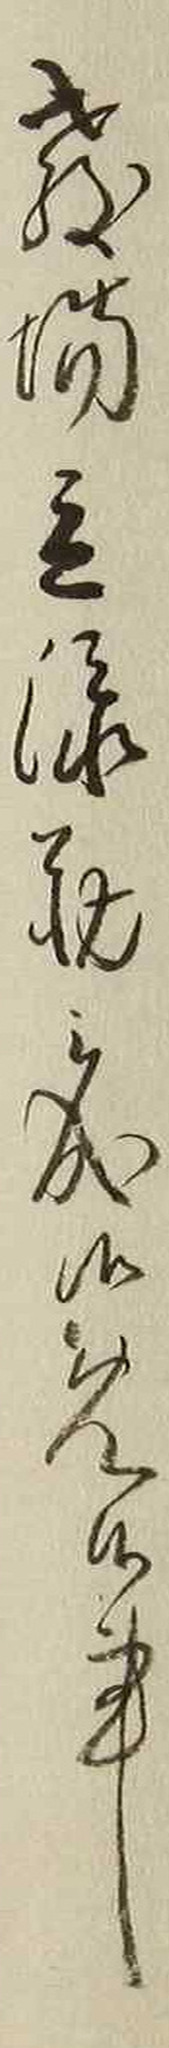教場立添勤被成御免候事
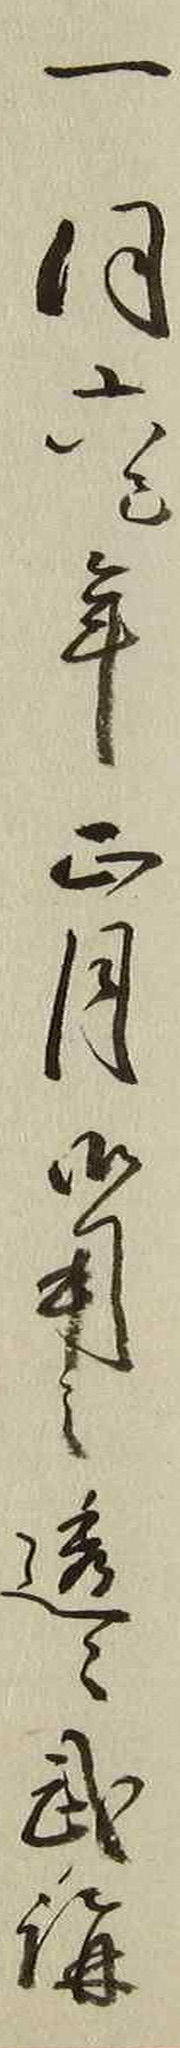一同六巳年正月御用之透々武講
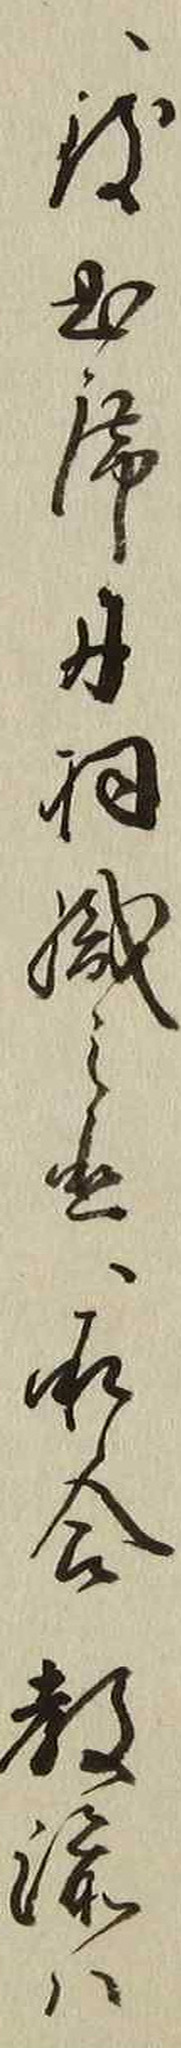へ致出席丹羽織之丞へ承合教諭は
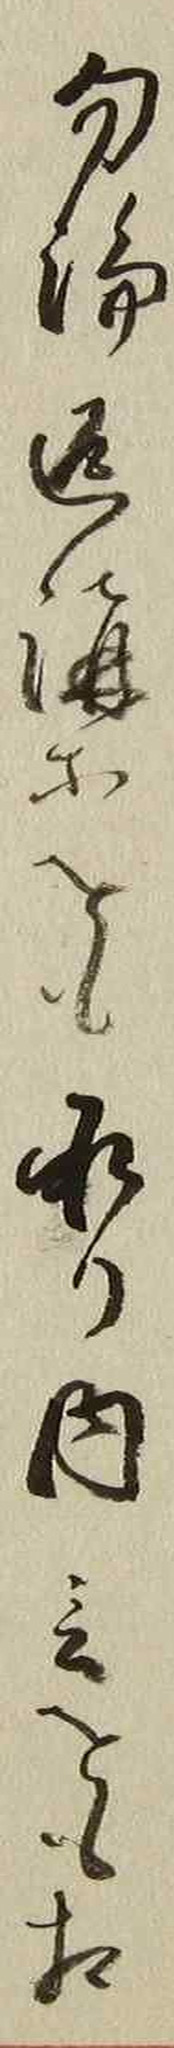勿論返講等をも承り内言をも相
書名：諸士系譜　巻之1　い之部1
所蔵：会津若松市立会津図書館
